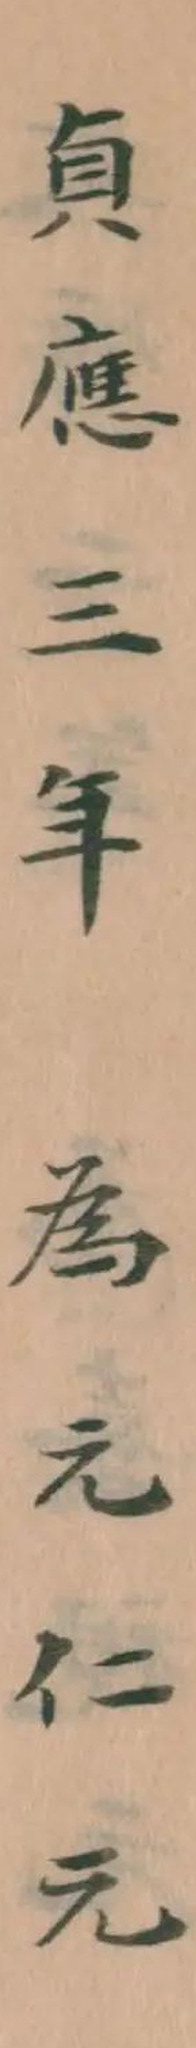貞応三年為元仁元
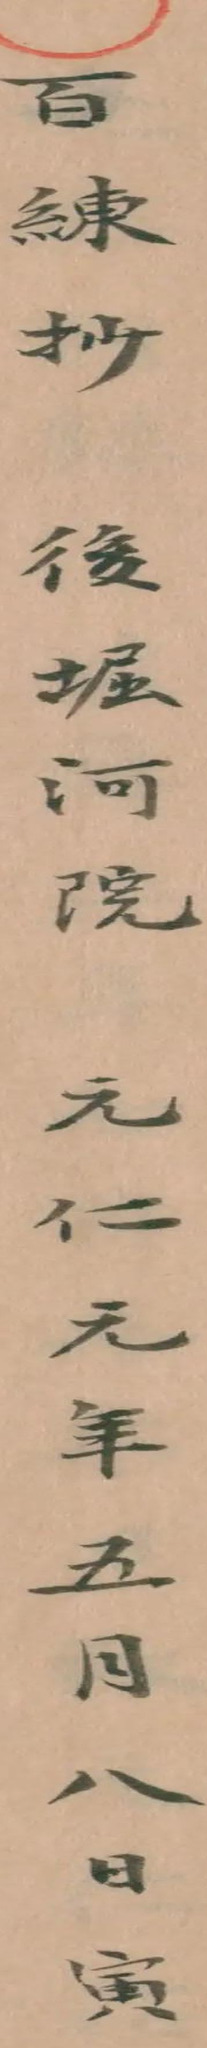○百練抄後堀河院元仁元年五月八日寅
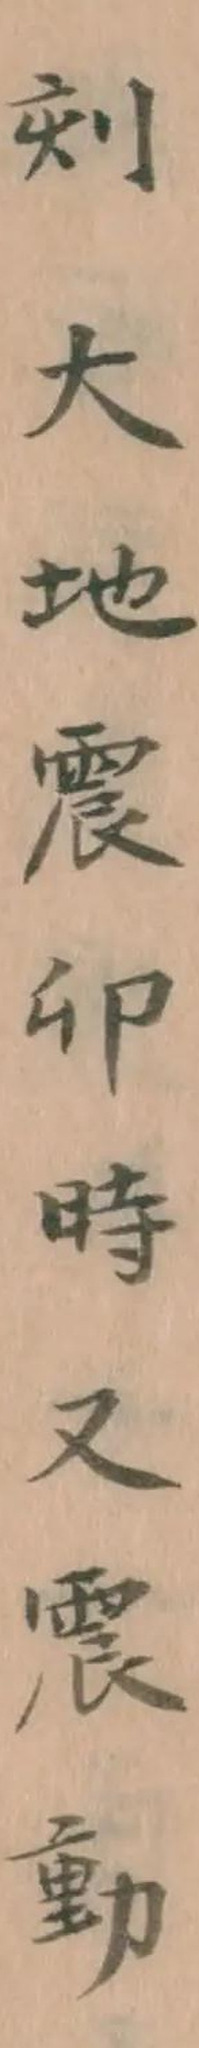刻大地震卯時又震動
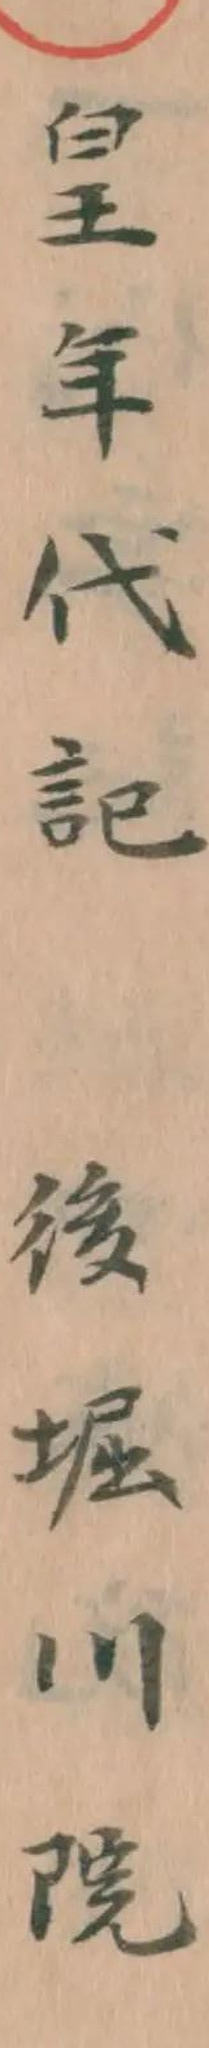○皇年代記後堀河院
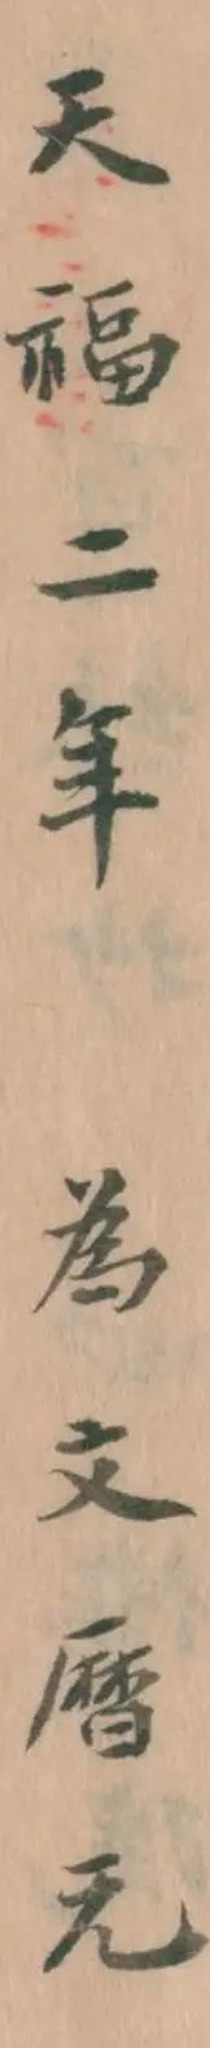天福二年為文暦元

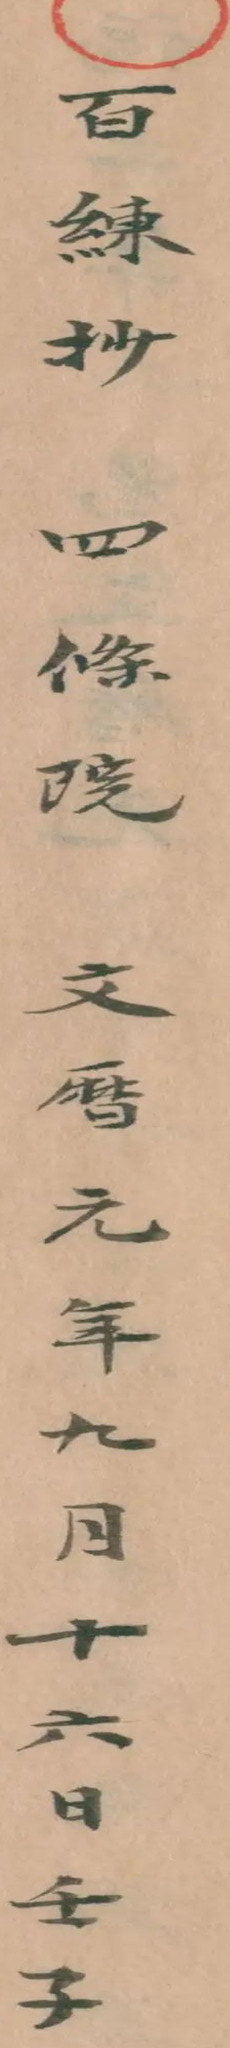○百練抄四条院文暦元年九月十六日壬子
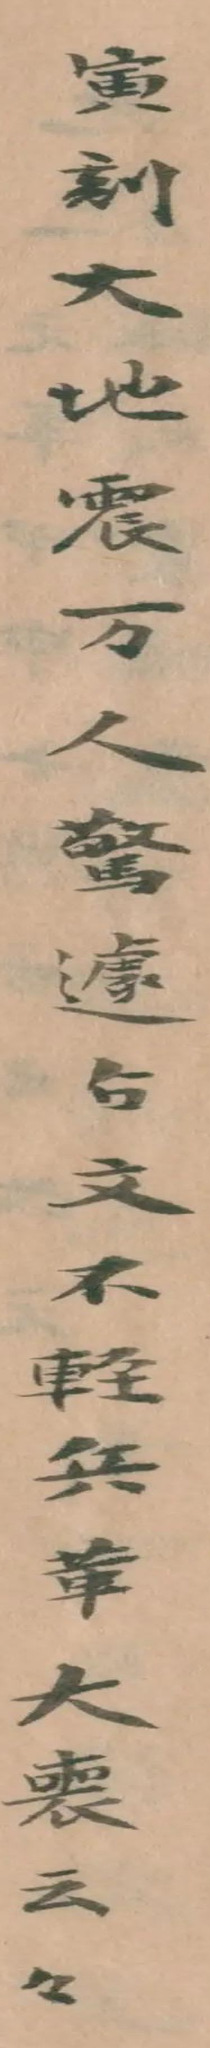寅刻大地震万人驚遽占文不軽兵革大喪云々
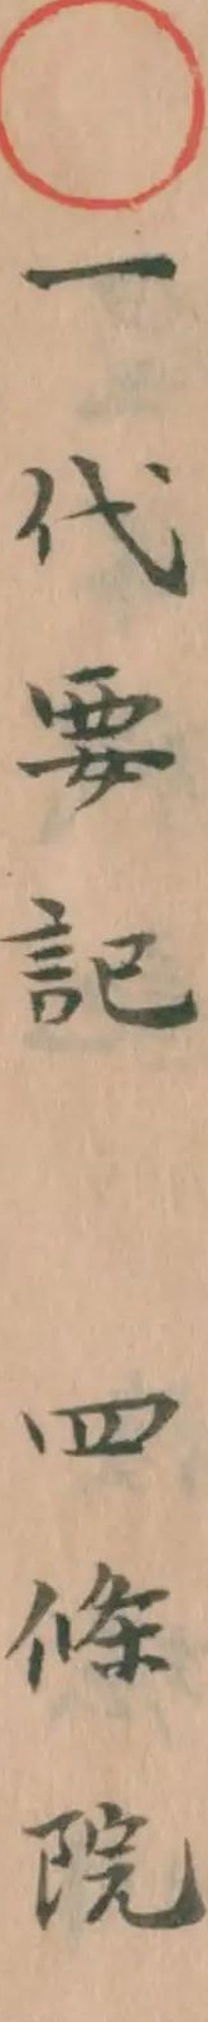○一代要記四条院
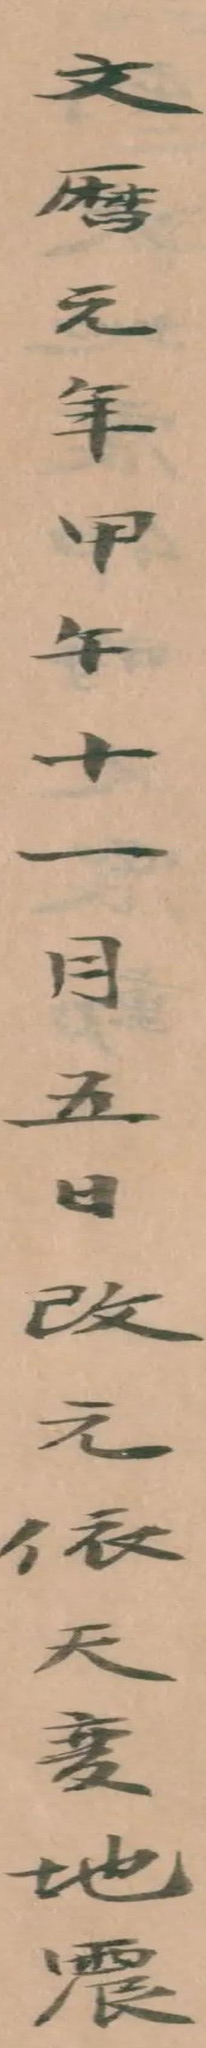文暦元年甲午十一月五日改元依天変地震
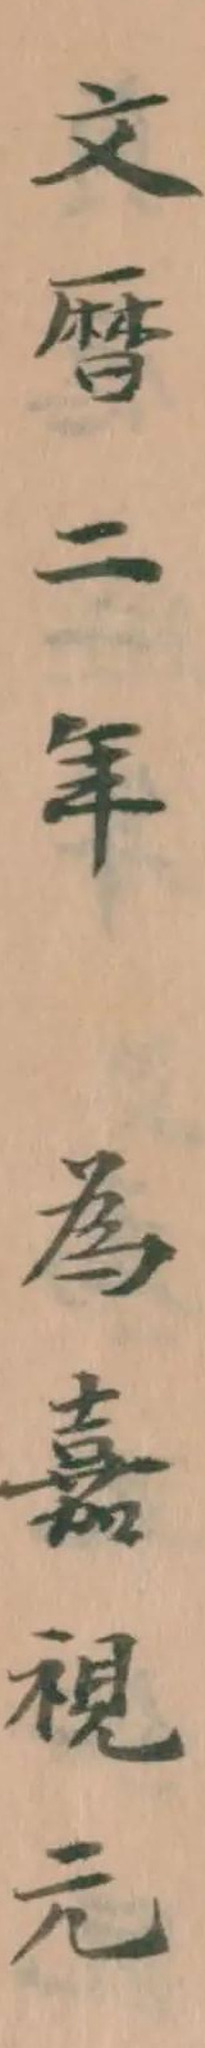文暦二年為嘉視元
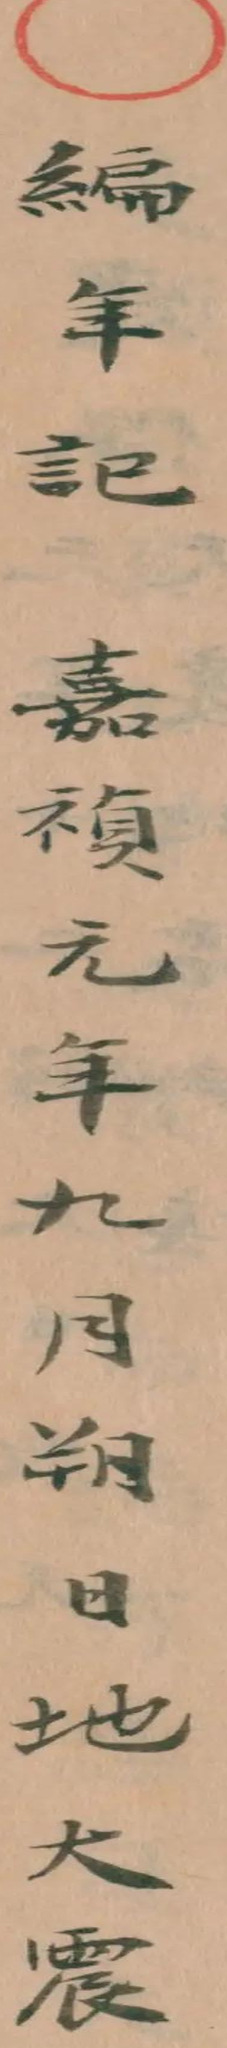○編年記嘉禎元年九月朔日地大震
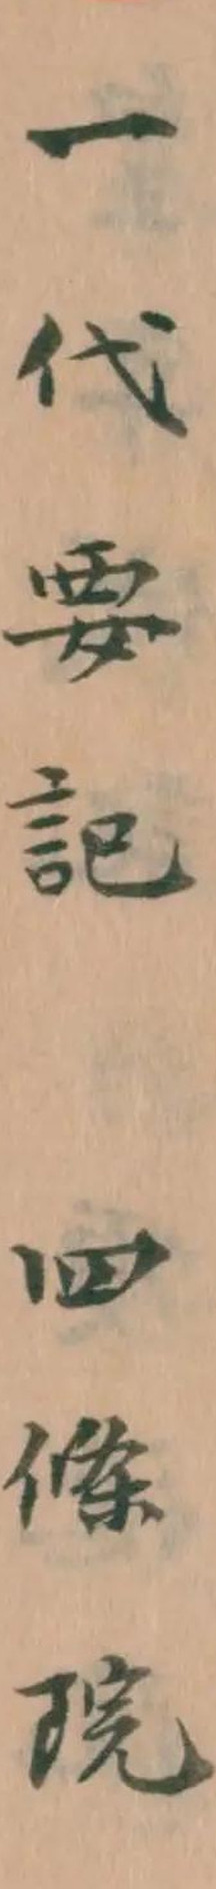○一代要記四条院
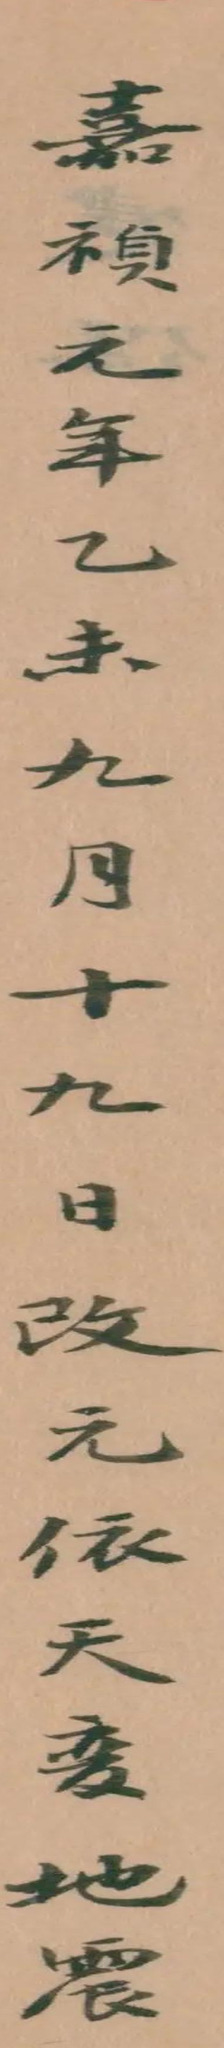嘉禎元年乙未九月十九日改元依天変地震
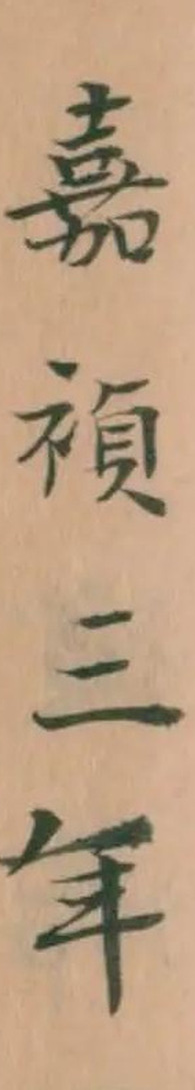嘉禎三年
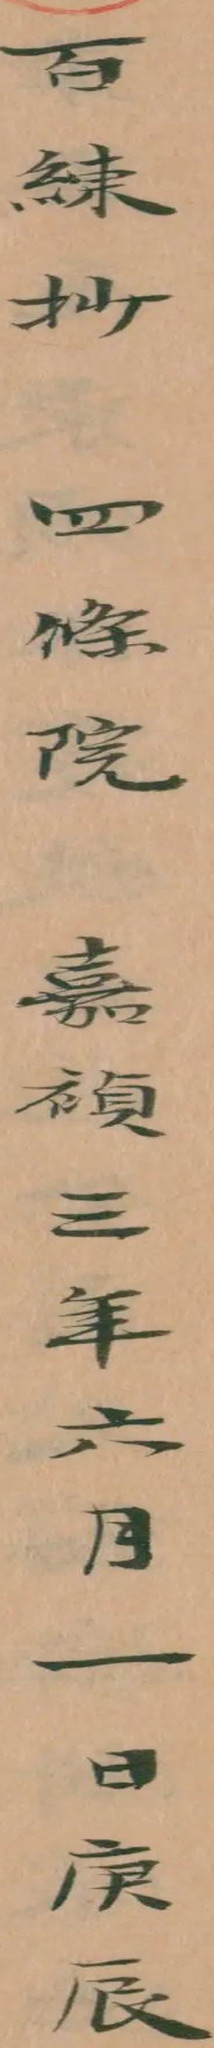○百練抄四条院嘉禎三年六月一日庚辰
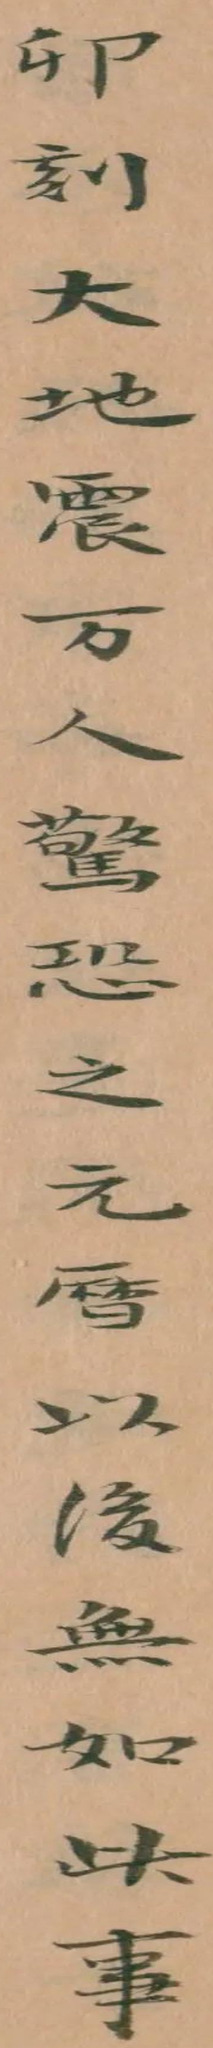卯刻大地震万人驚恐之元暦以後無如此事
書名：地災撮要. 巻5-6(地震之部)
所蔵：国立国会図書館 National Diet Library, JAPAN
